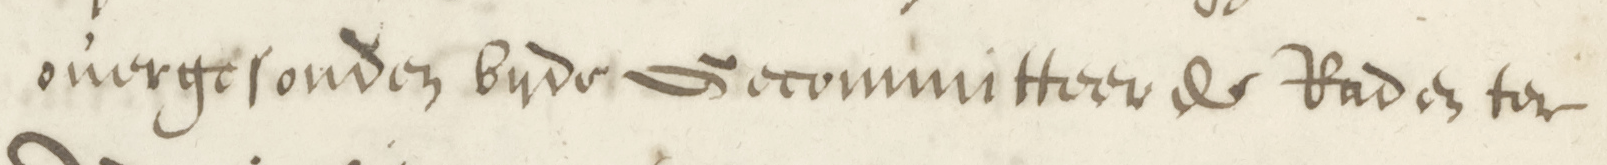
ouergesonden byde Gecommitteerde Raden ter
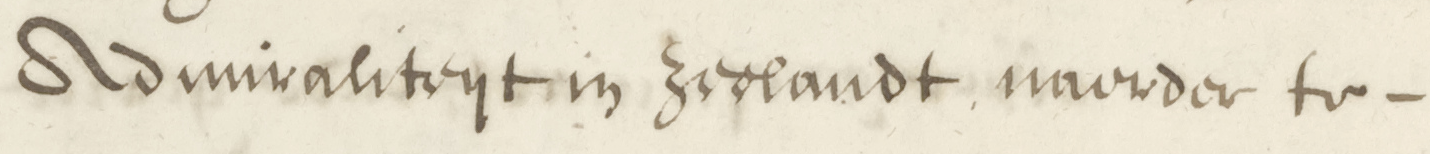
Admiraliteyt in zeelandt, naerder te
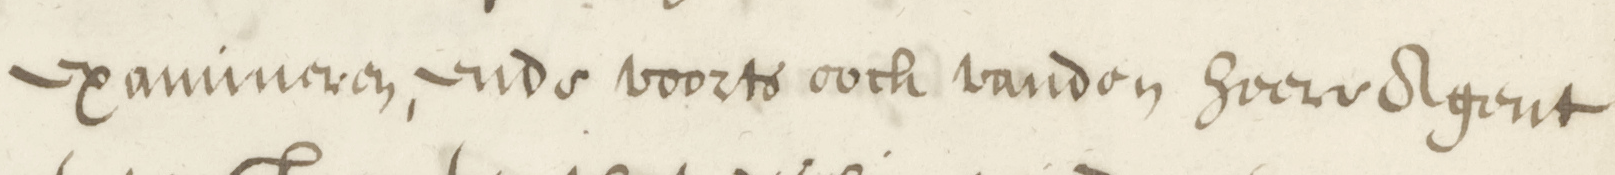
examineren, ende voorts oock vanden heere Agent
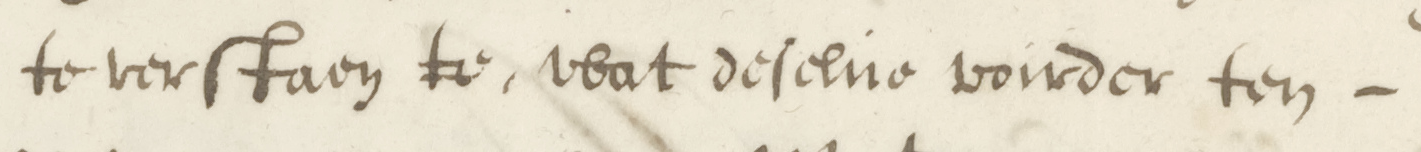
te verstaen te, wat deselue voirder ten -
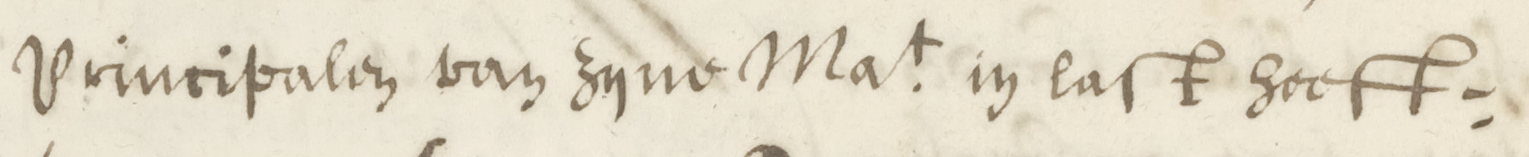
Principalen van zyne Mat. in last heeft:
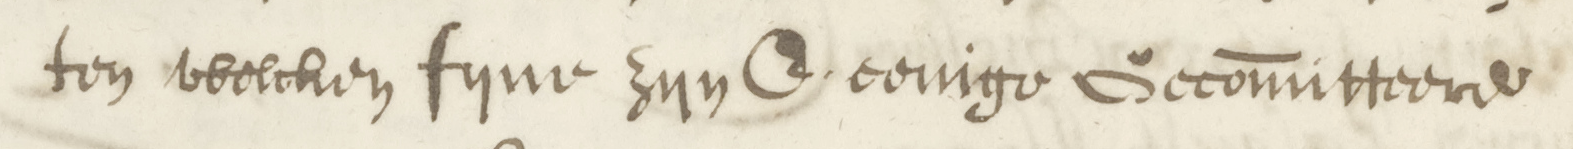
ten welcken fyne zyn E. eenige Gecomitteerde
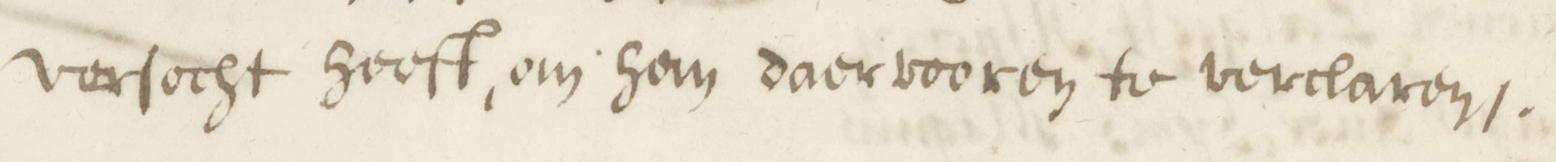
versocht heeft, om hem daervooren te verclaren.
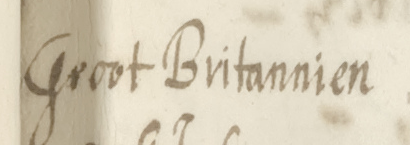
Groot Bitannien
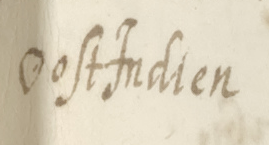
OostIndien
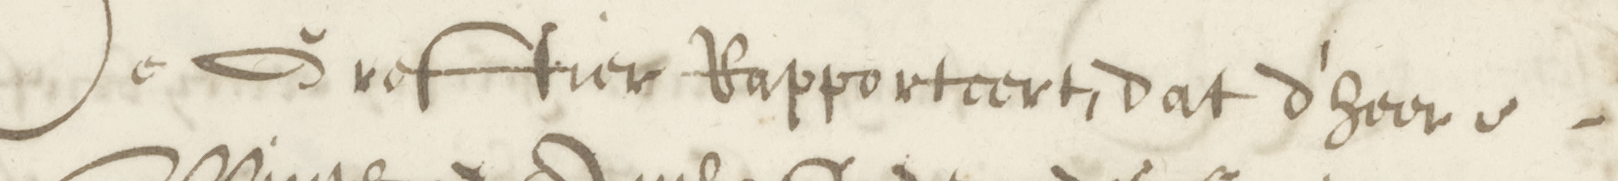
De Greffier Rapporteert, dat d'heere -
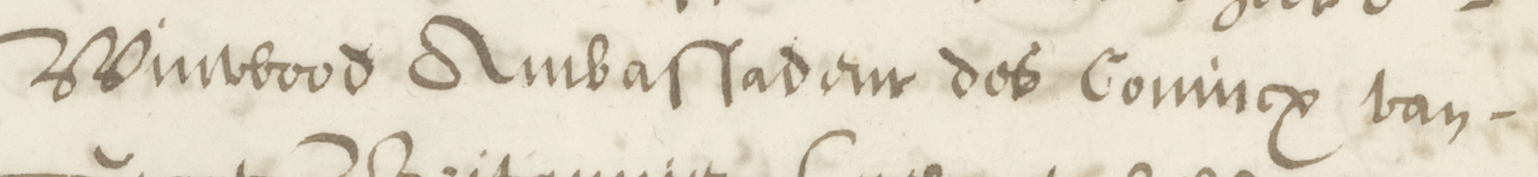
Winwood Ambassadeur des Conincx van -
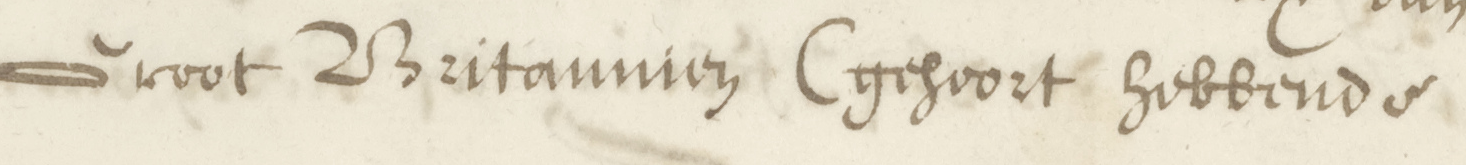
Groot Britannien (gehoort hebbende
